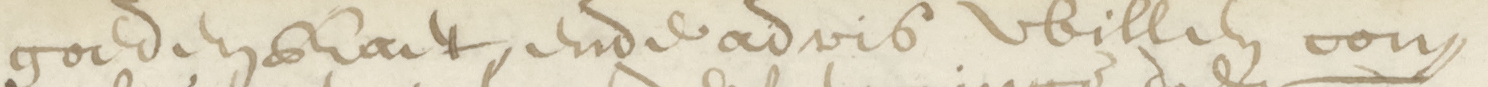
goeden Raet, ende advis willen con,,
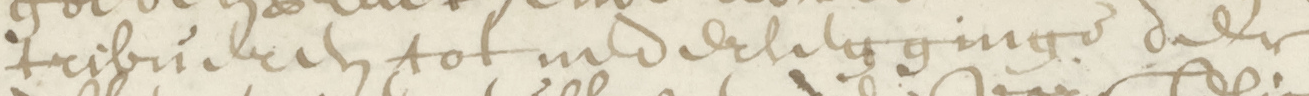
tribueren tot nederlegginge der
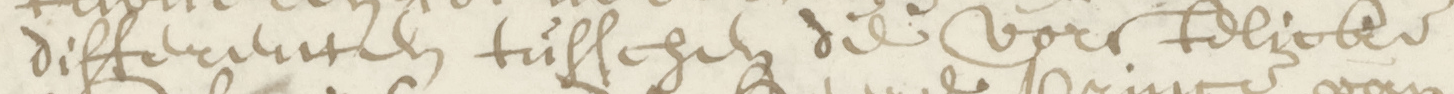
differenten tusschen de vorstelicke
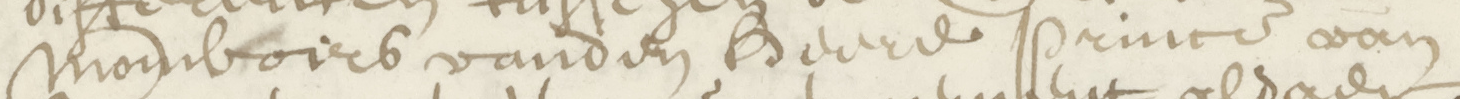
momboirs vanden Heere Prince van
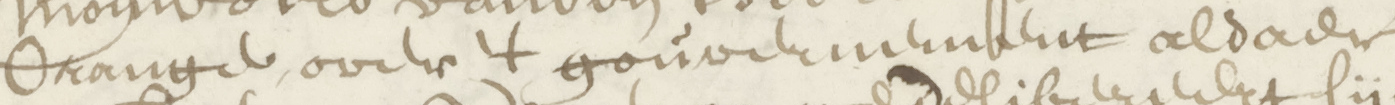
Orange, over 't gouvernement aldaer
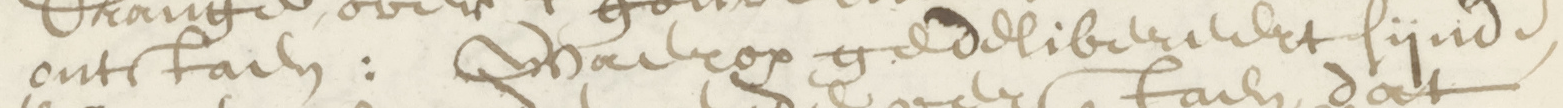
ontstaen: Waerop gedelibereert sijnde,
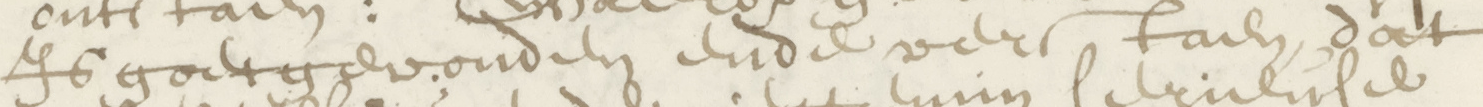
Is goetgevonden ende verstaen, dat
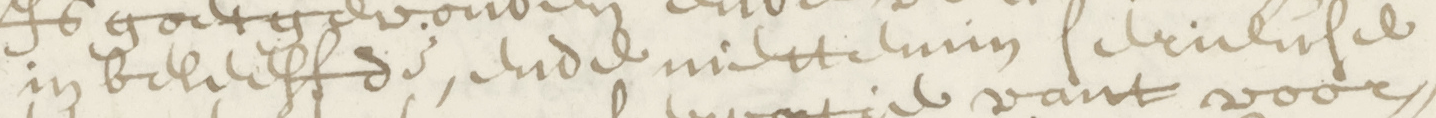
in beleeffde, ende niettemin serieuse
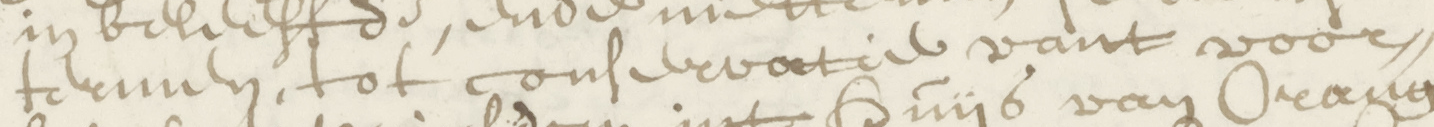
termen, tot conservatie vant voor,,
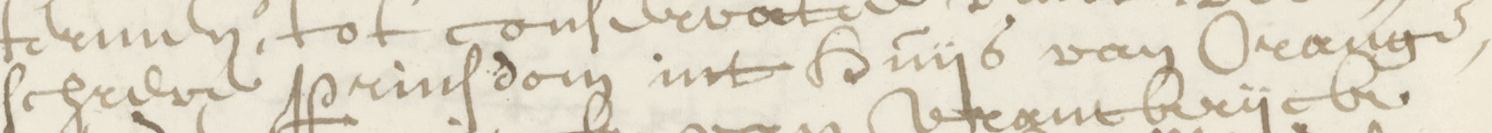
schreve prinsdom int Huijs van Orange,
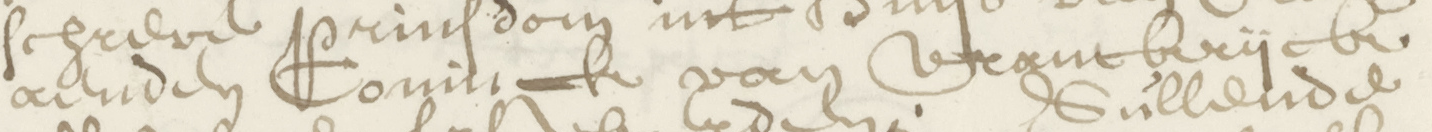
aenden Coninck van vranckrijck
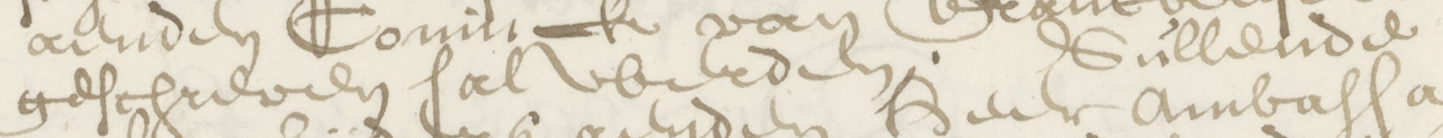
geschreven sal werden. Sullende
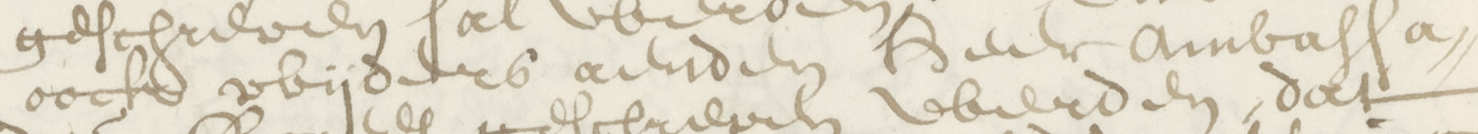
oock wijders aenden Heer Ambassa,,
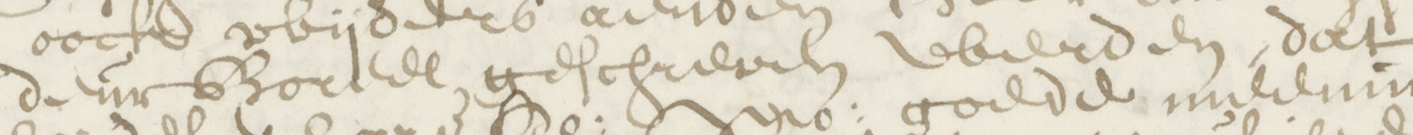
deur Boreel geschreven werden, dat
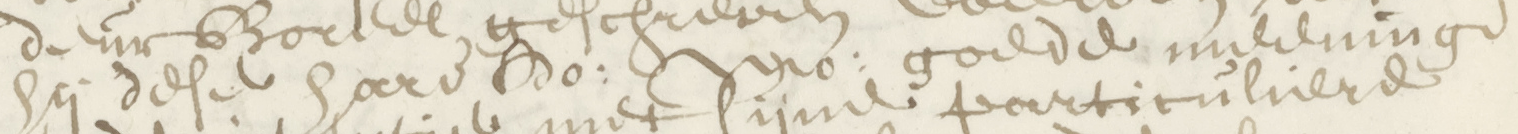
hij dese hare Ho:Mo: goede meeninge
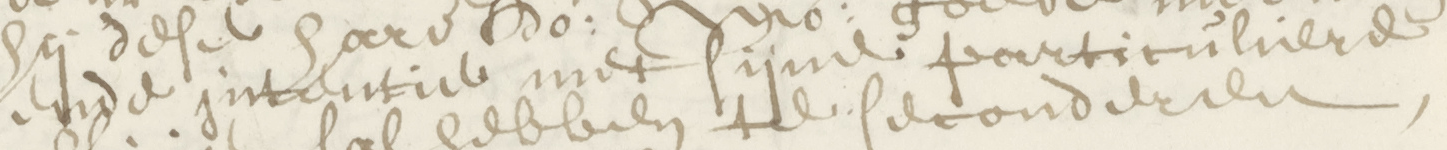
ende intentie met sijne particuliere
